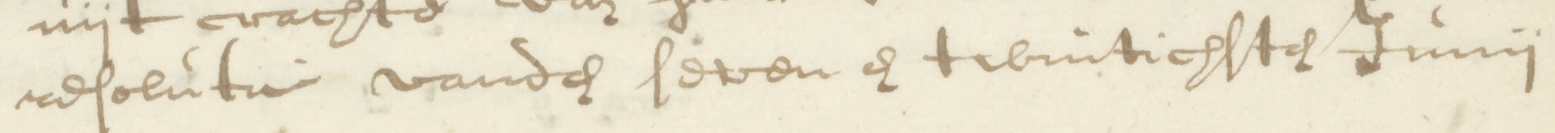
resolutie vanden seven en twintichsten Junij
